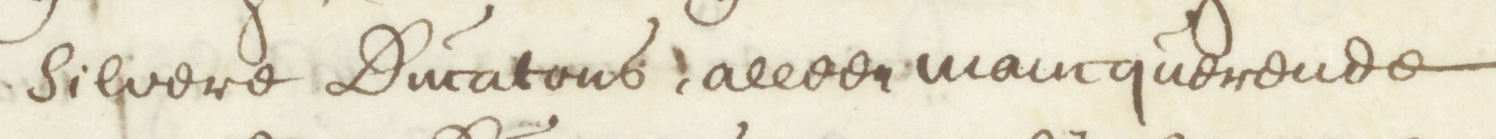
Silvere Ducatons,alleen mancquerende
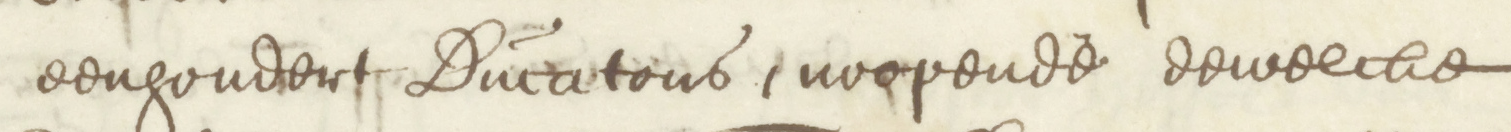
eenhondert Ducatons, noopende dewelcke
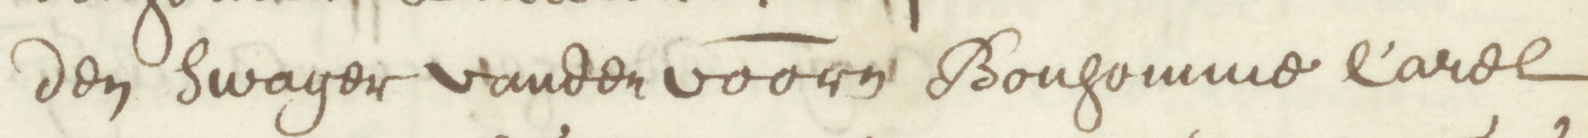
den Swager vanden voorn Bonhomme Carel
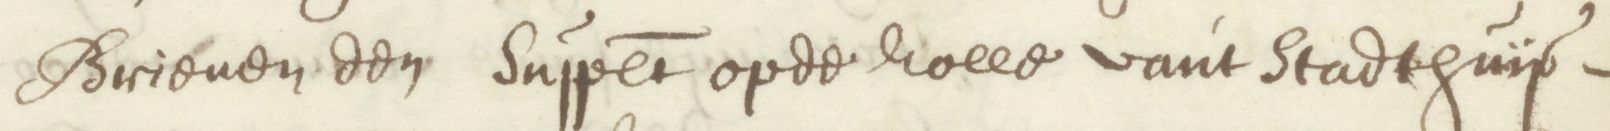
Brienen den Supplt opde rolle van't Stadthuijs
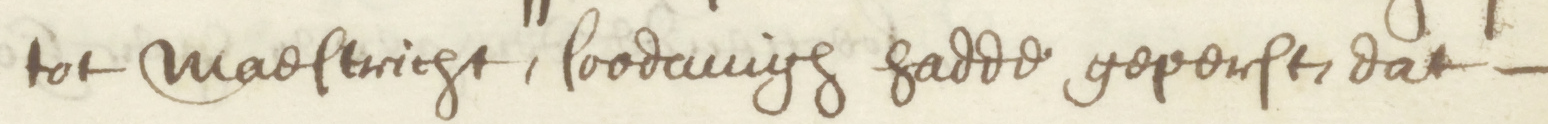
tot maestricht, soodanigh hadde geperst, dat -
